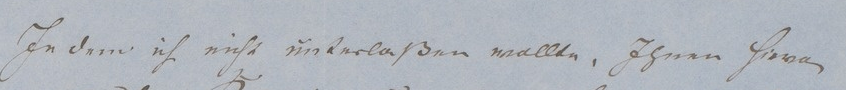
Indem ich nicht unterlaßen wollte, Ihnen hievon
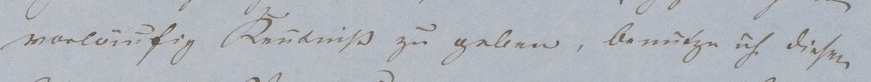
vorläufig Kenntniß zu geben, benutze ich diesen
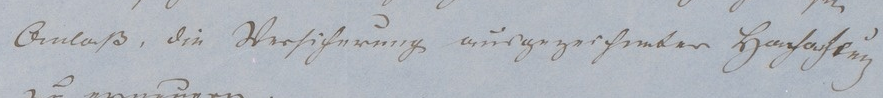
Anlaß, die Versicherung ausgezeichneter Hochachtung
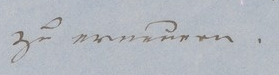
zu erneuern.
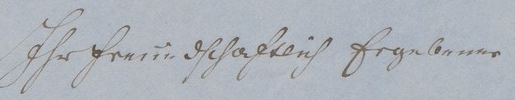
Ihr freundschaftlich Ergebener
